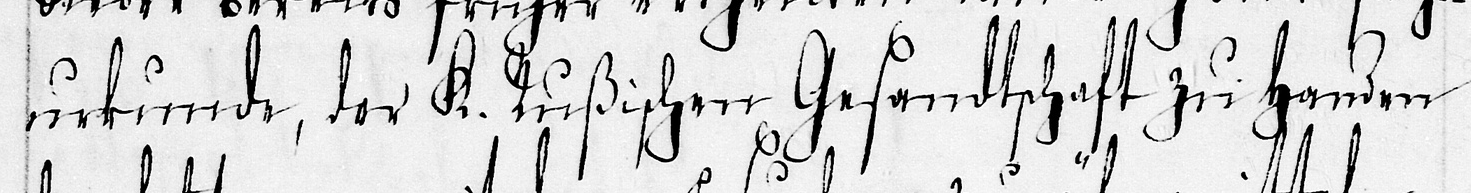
urkunde, der K. Rußischen Gesandtschaft zu Handen
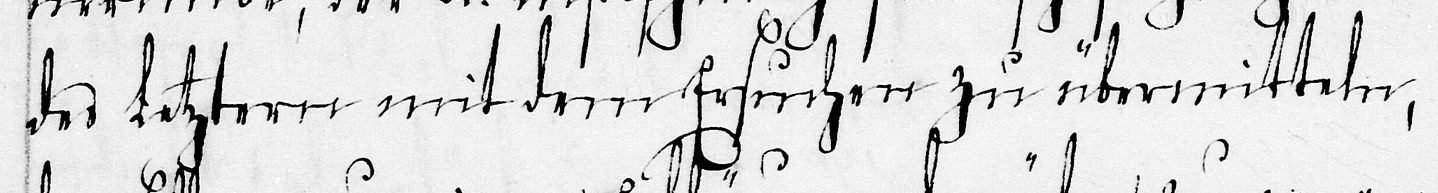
der Letztern mit dem Ersuchen zu übermitteln,
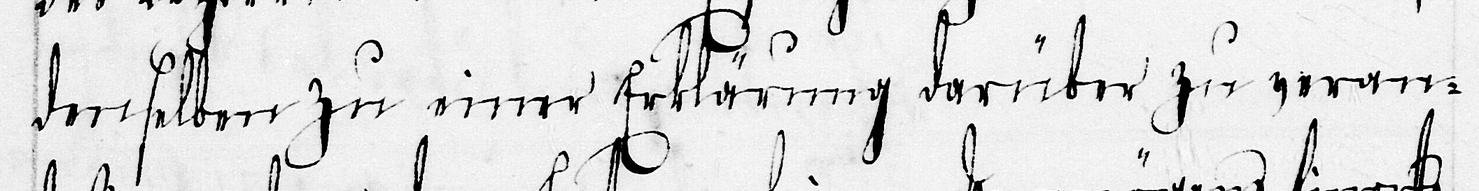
denselben zu einer Erklärung darüber zu veran¬
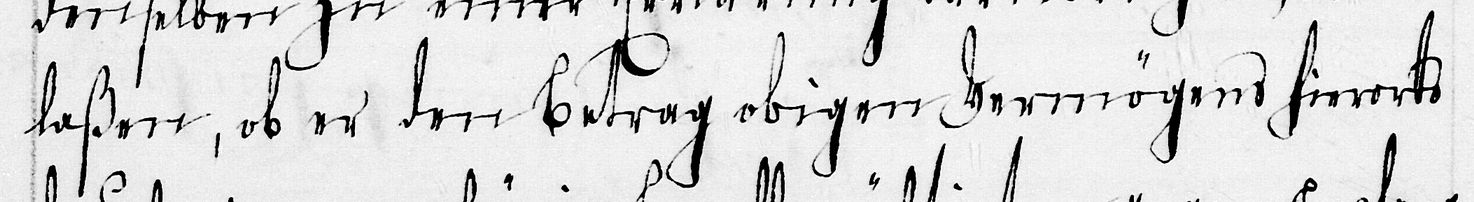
laßen, ob er den Betrag obigen Vermögens hierorts
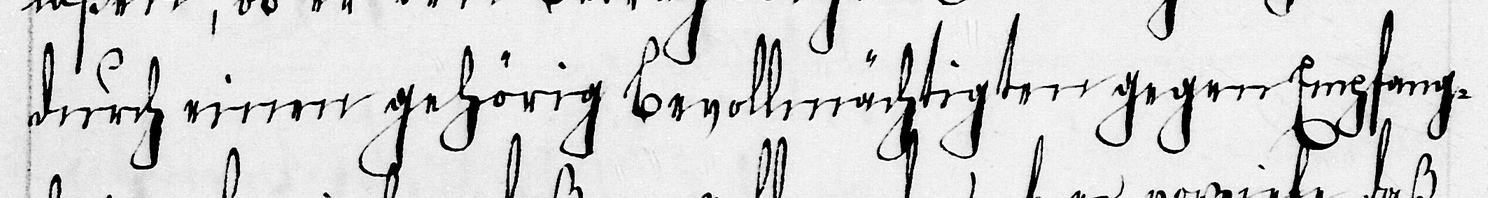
durch einen gehörig Bevollmächtigten gegen Empfang¬
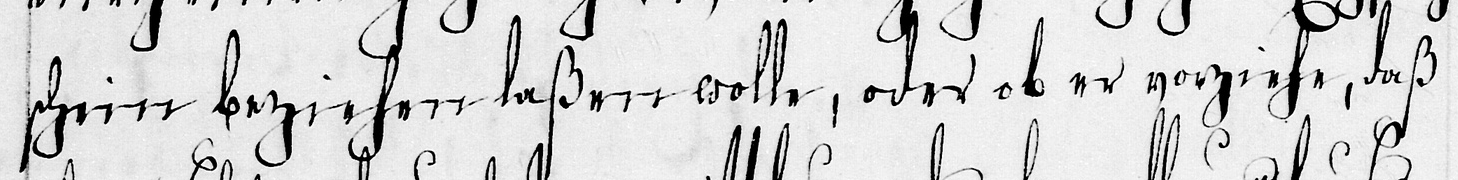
schein beziehen laßen wolle, oder ob er vorziehe, daß
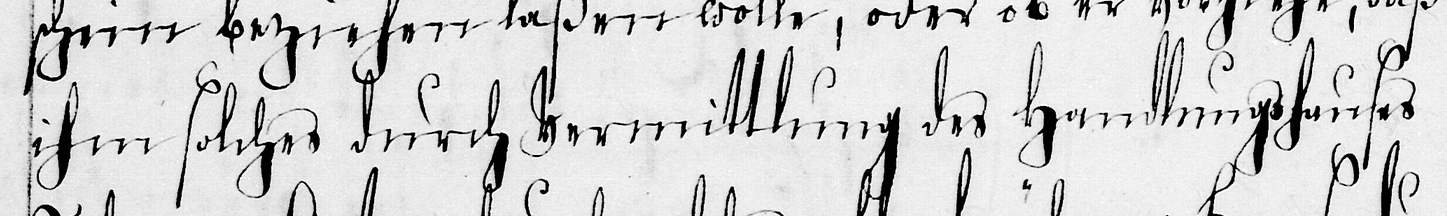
ihm solches durch Vermittlung des Handlungshauses
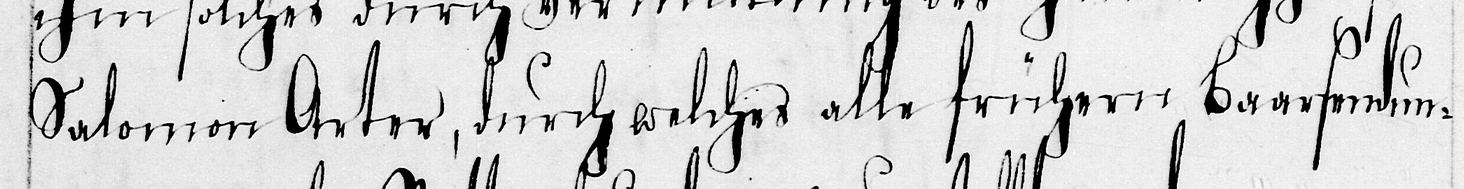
Salomon Arter, durch welches alle frühern Baarsendun¬
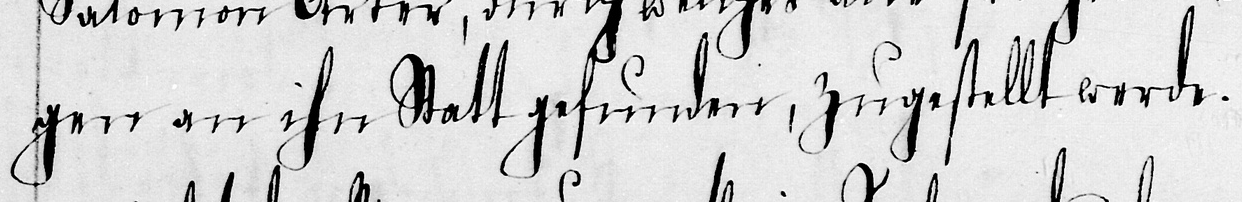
gen an ihn Statt gefunden, zugestellt werde.
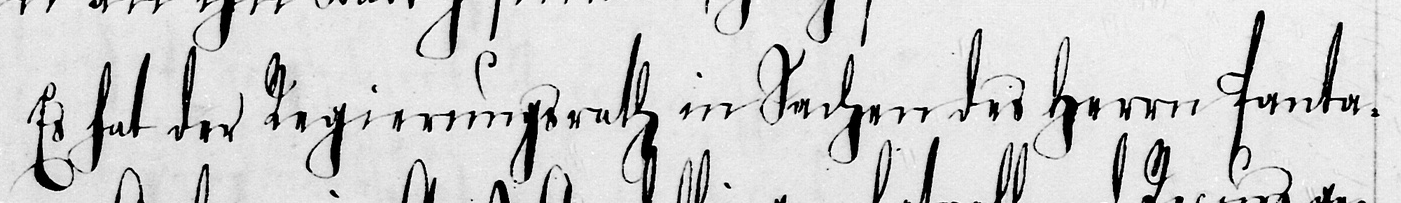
Es hat der Regierungsrath in Sachen des Herrn Panta¬
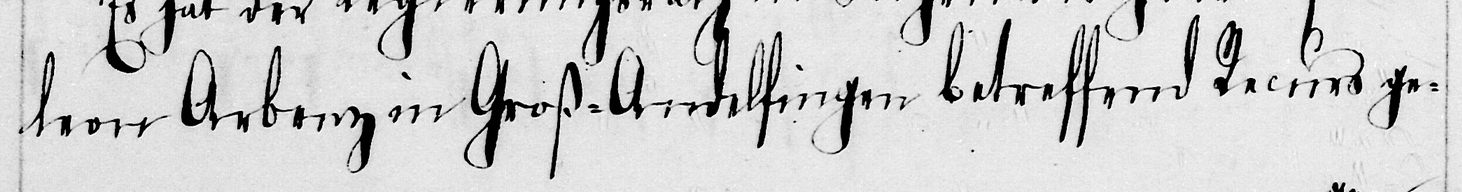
leon Arbenz in Groß-Andelfingen betreffend Recurs ge-
